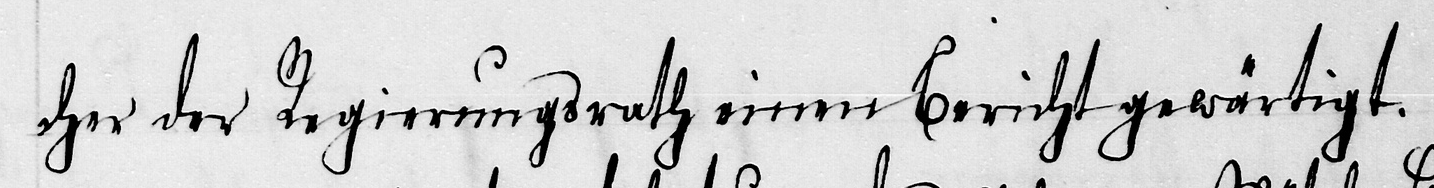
cher der Regierungsrath einen Bericht gewärtigt.
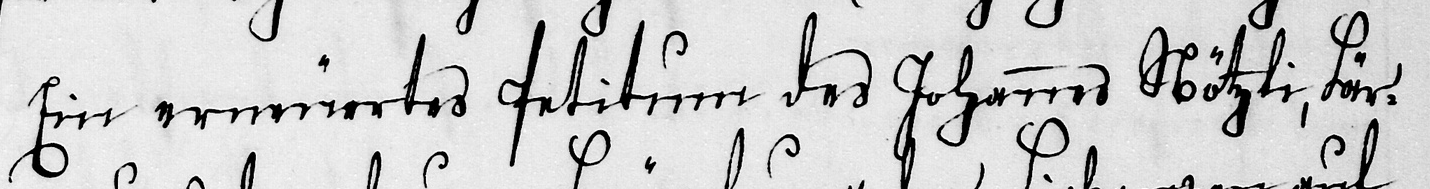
Ein erneuertes Petitum des Johannes Nötzli, Fär¬
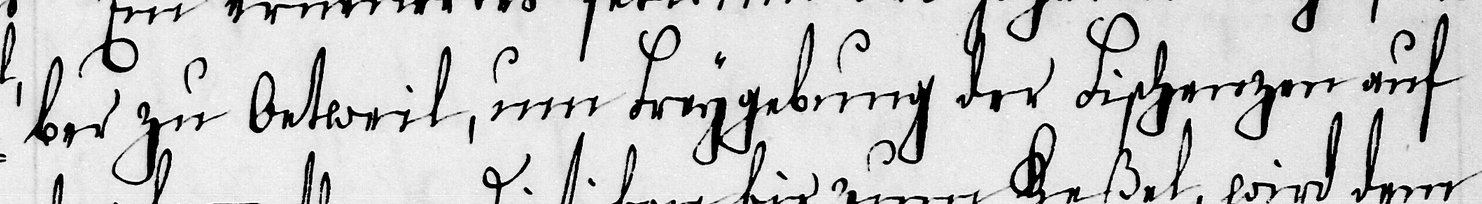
ber zu Oetweil, um Freygebung der Fischenzen auf
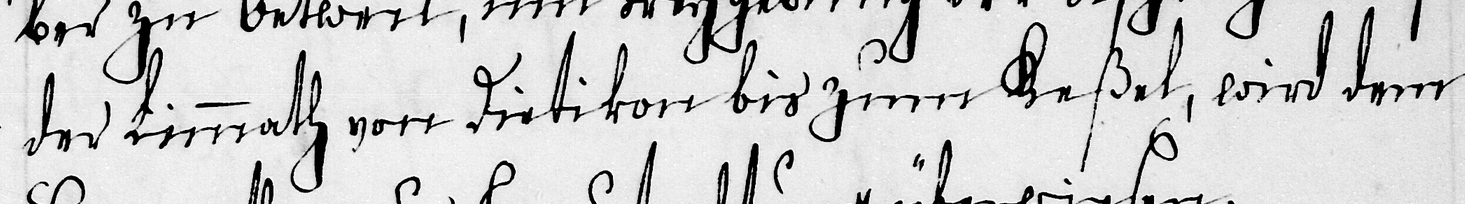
der Limmath von Dietikon bis zum Keßel, wird dem
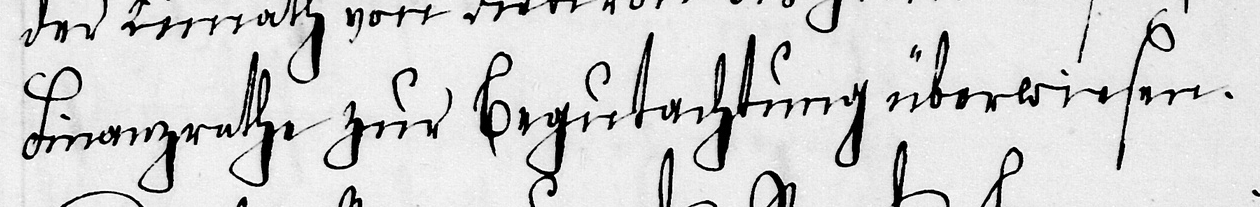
Finanzrathe zur Begutachtung überwiesen.
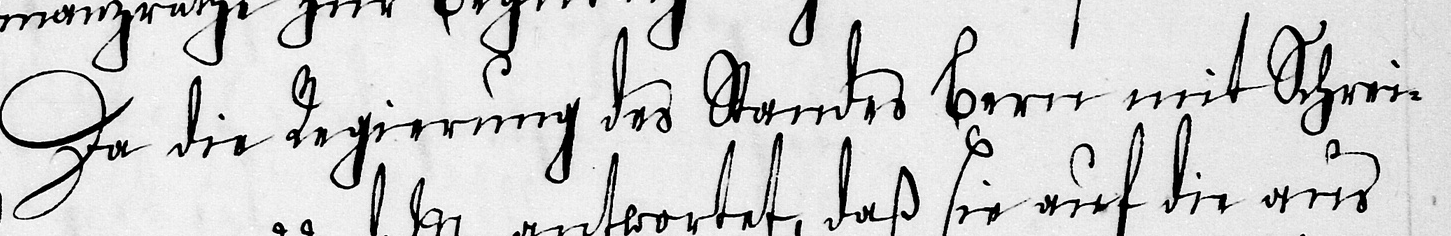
Da die Regierung des Standes Bern mit Schrei¬
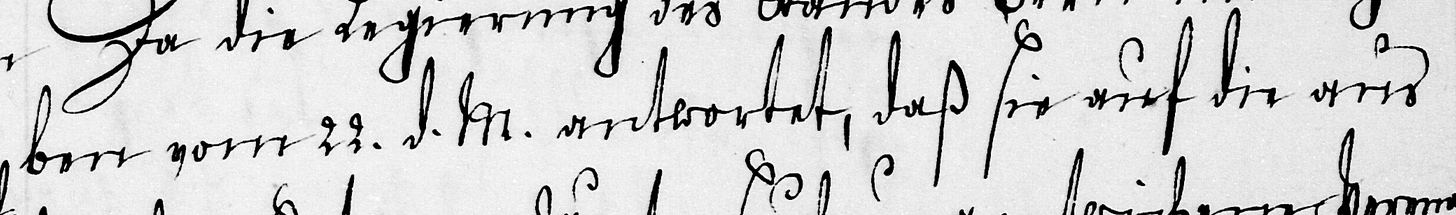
ben vom 22. d. M. antwortet, daß sie auf die aus
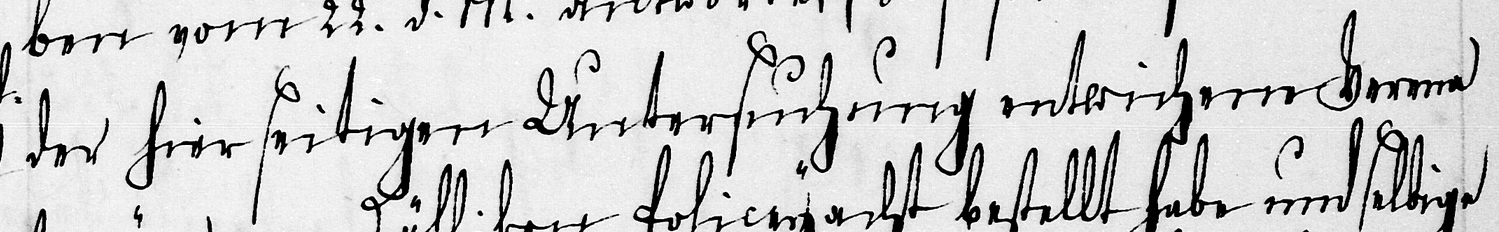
der hierseitigen Untersuchung entwichene Verena
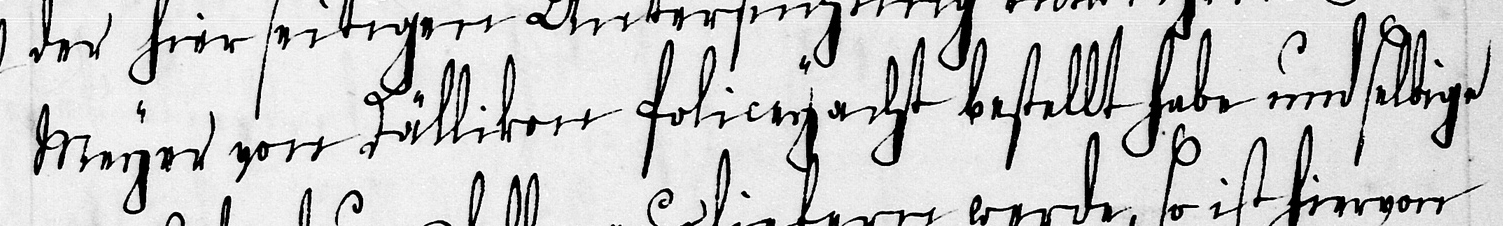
Meyer von Dällikon Policeyacht bestellt habe und selb¬
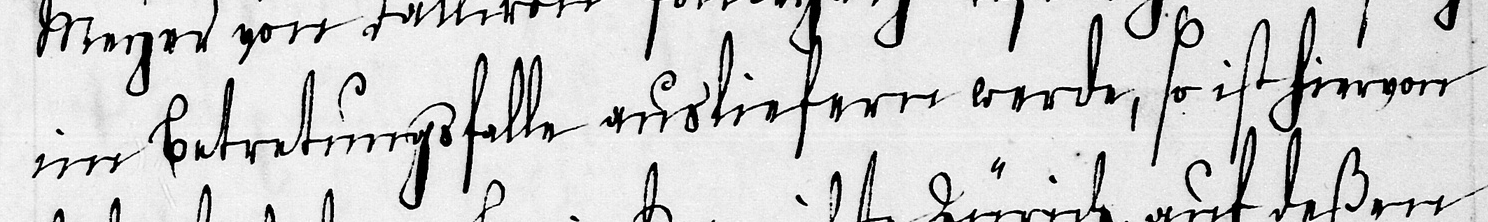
im Betretungsfalle ausliefern werde, so ist hiervon
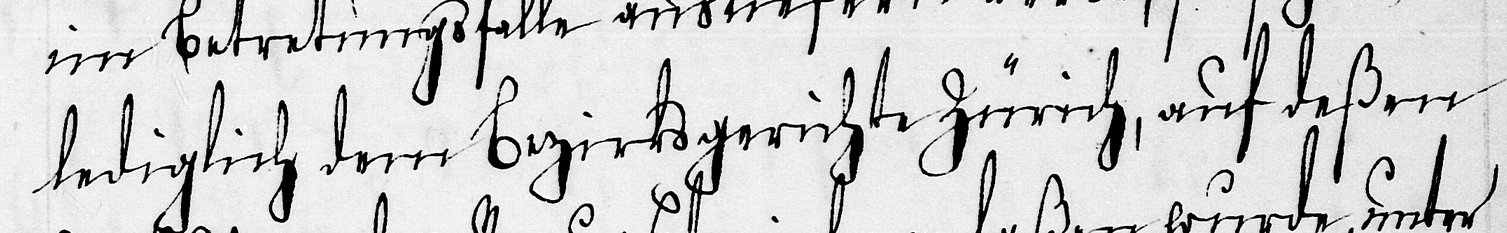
lediglich dem Bezirksgerichte Zürich, auf deßen
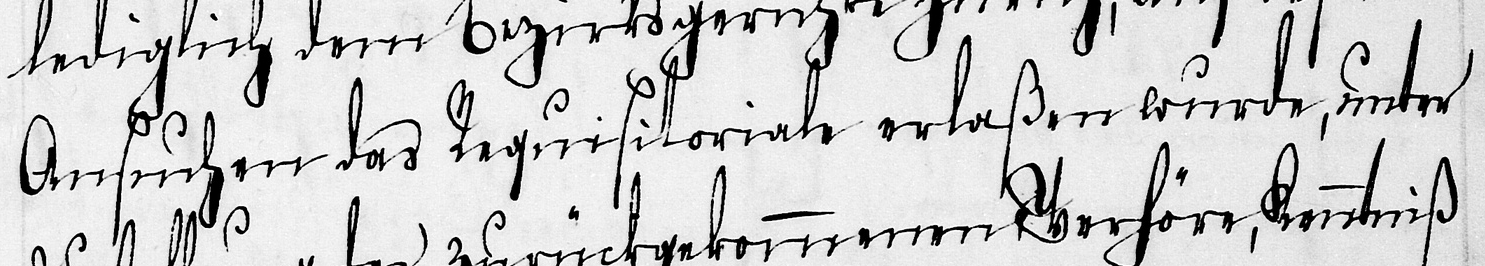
Ansuchen das Requisitoriale erlaßen wurde, unter
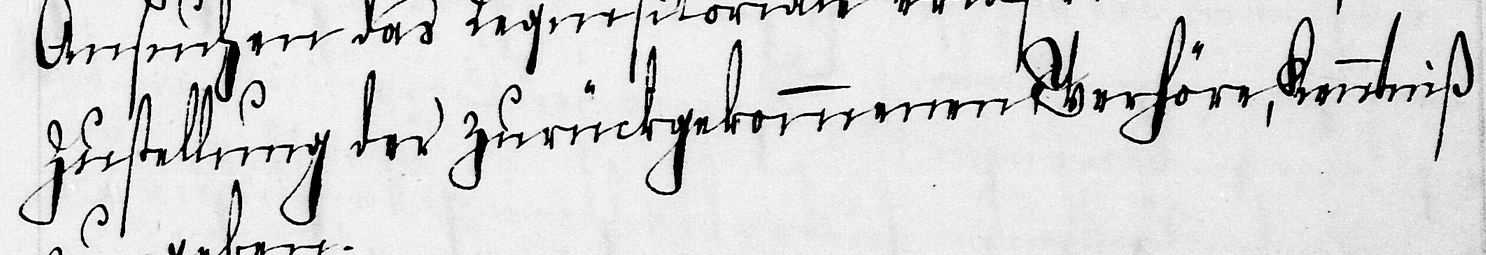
Zustellung der zurückgekommenen Verhöre, Kenntniß
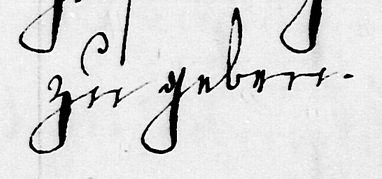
zu geben.
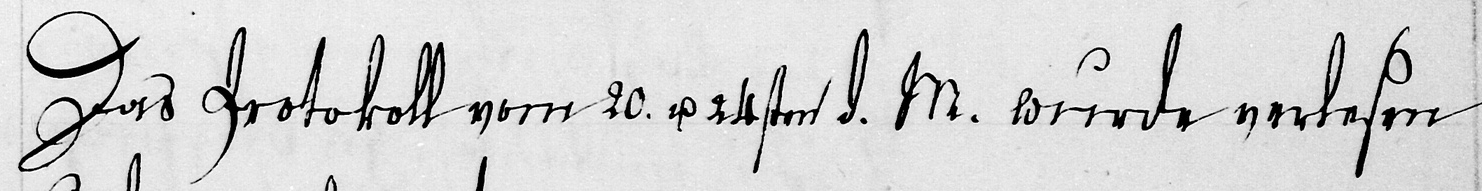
Das Protokoll vom 20. u. 24sten d. M. wurde verlesen
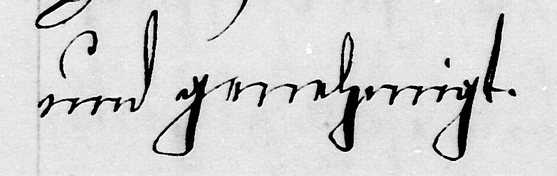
und genehmigt.
